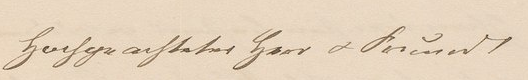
Hochgeachteter Herr & Freund
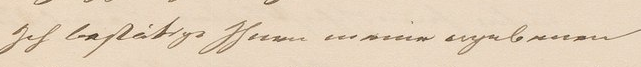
Ich bestätige Ihnen meine ergebenen
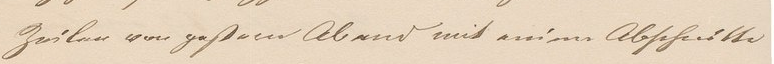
Zeilen von gestern Abend mit einem Abschnitte
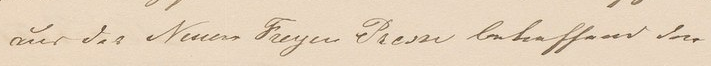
aus der Neuen Freyen Presse betreffend den
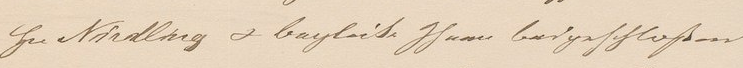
Hr. Nördling & begleite Ihnen beigeschloßen
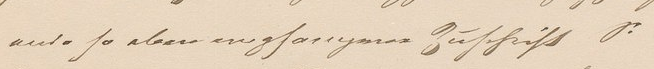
eine so eben empfangene Zuschrift Sr
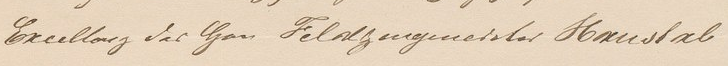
Excellenz des Herr Feldzeugmeister Hauslab
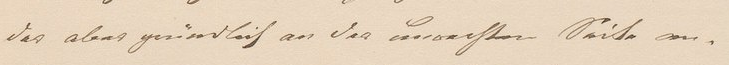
der aber gründlich an der unrechten Seite an-
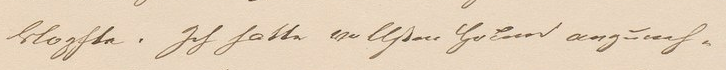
klopfte. Ich hatte vollsten Grund anzuneh-
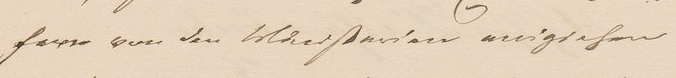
ferne von den Ministerien einziehen
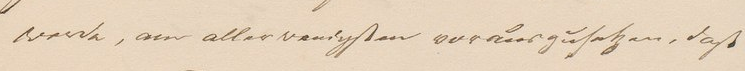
werde, am allerwenigsten vorauszusetzen, daß
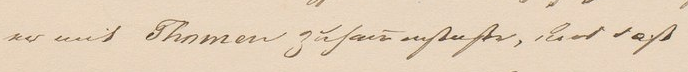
er mit Thomen zusammenstoße, und daß
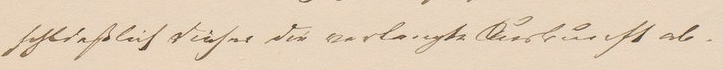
schließlich dieser die verlangte Auskunft ab-
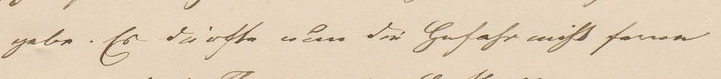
gebe. Es dürfte nun die Gefahr nicht ferne
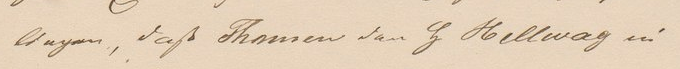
liegen, daß Thomen den H Hellwag in
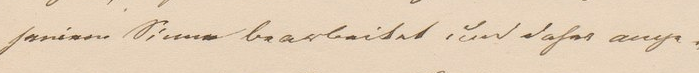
seinem Sinne bearbeitet, und daher ange-
